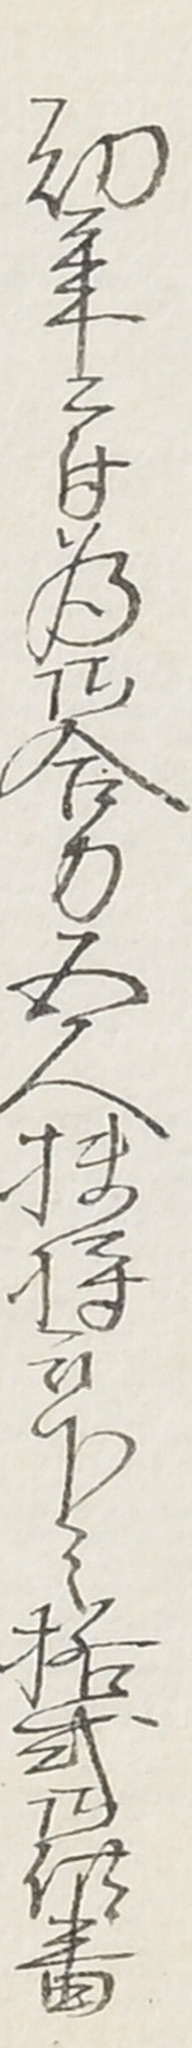幼年ニ付為御合力五人扶持被下之格式御供番
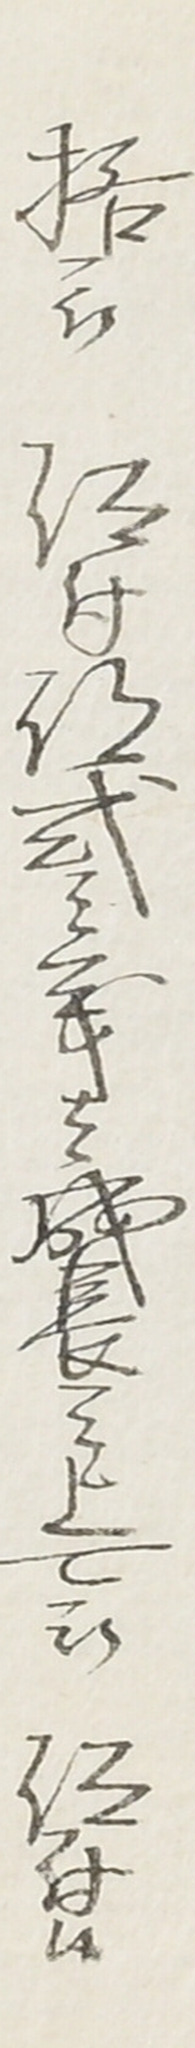格被仰付跡式之義者成長之上可被仰付候
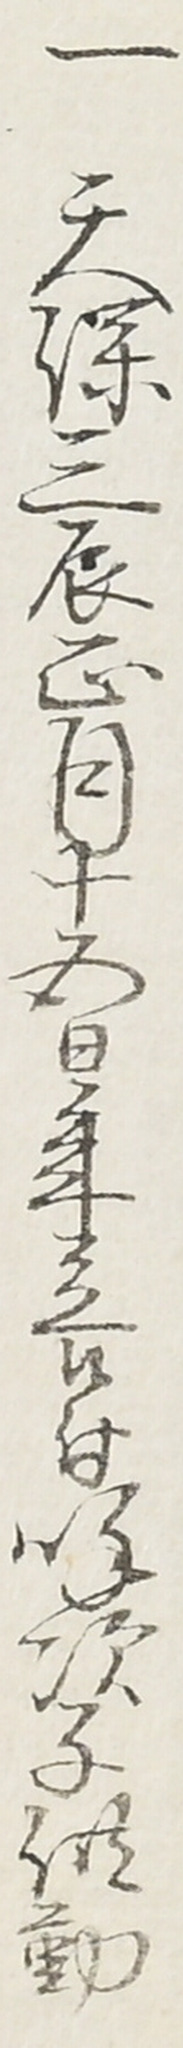一天保三辰正月十五日年立候付呼次子供勤
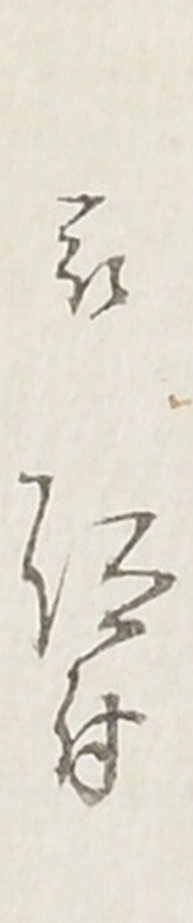被仰付
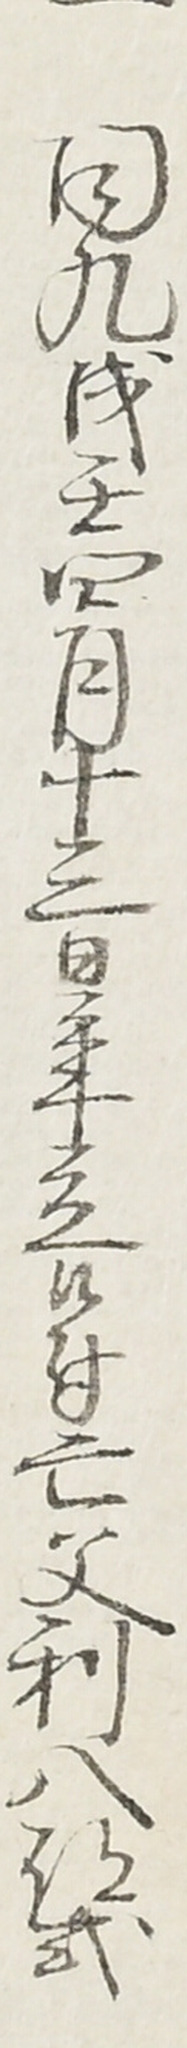一同九戌閏四月十三日年立候付亡父利八跡式
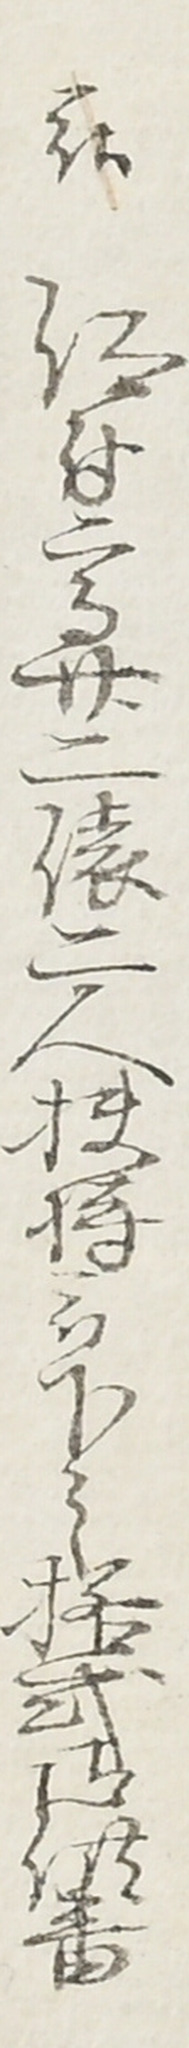被仰付高廿二俵二人扶持被下之格式御供番
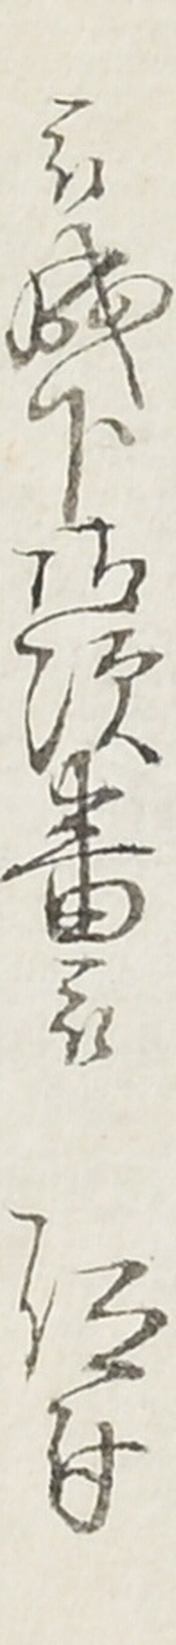被成下御次番被仰付
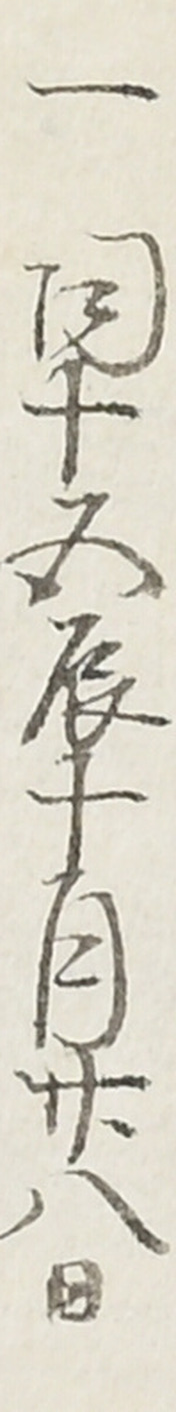一同十五辰十月廿八
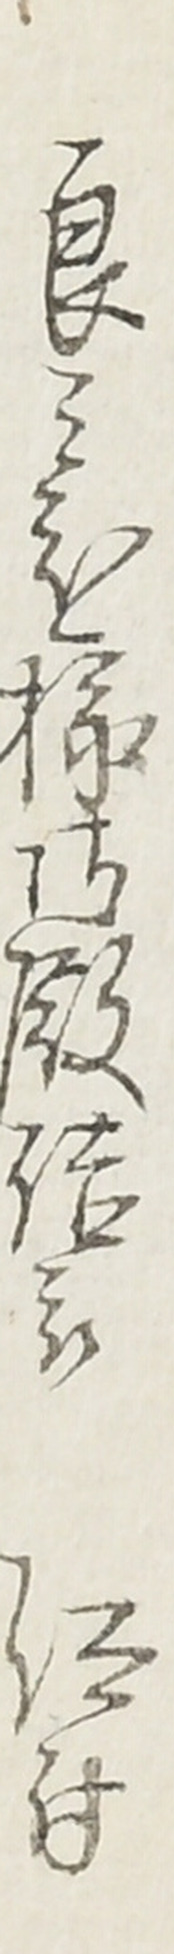良之進様御殿詰被仰付
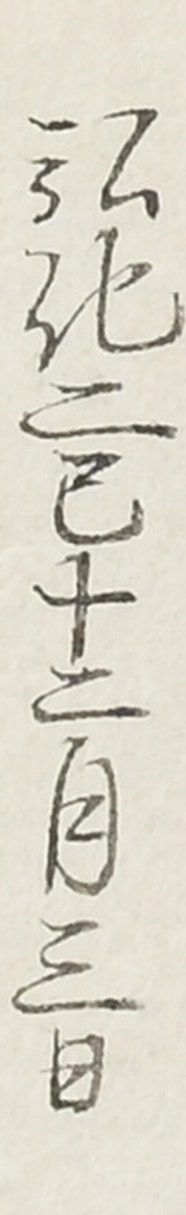一弘化二巳十二月三日
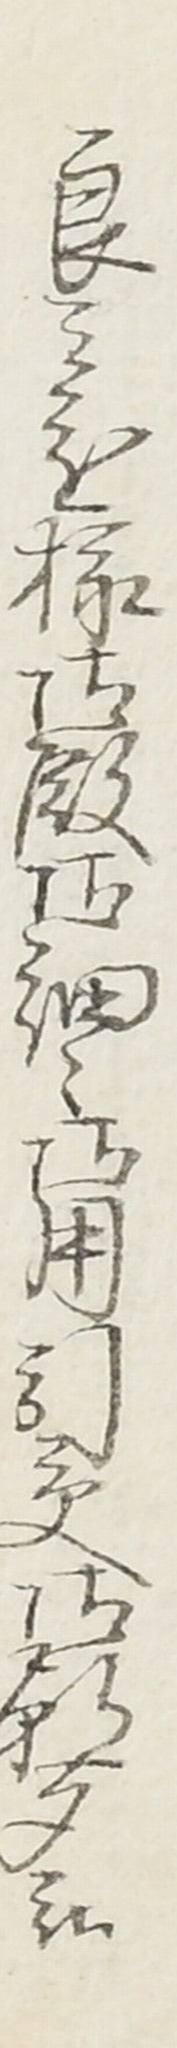良之進様御殿御細々御用引受御朝夕被
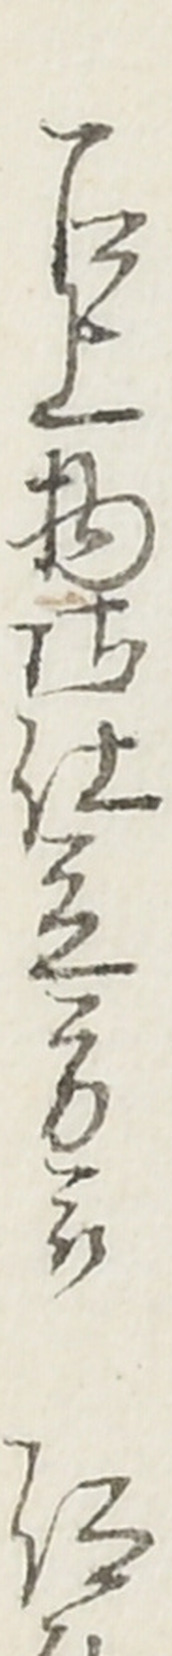召上物御仕立方被仰付

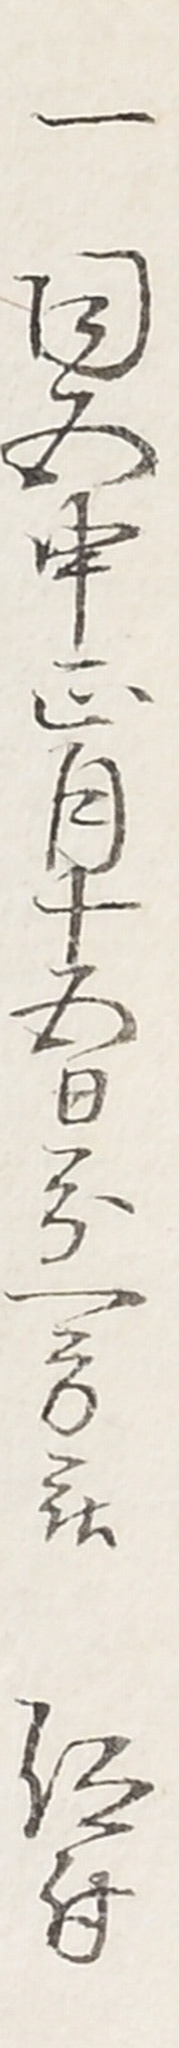一同五申正月十五日分一方被仰付
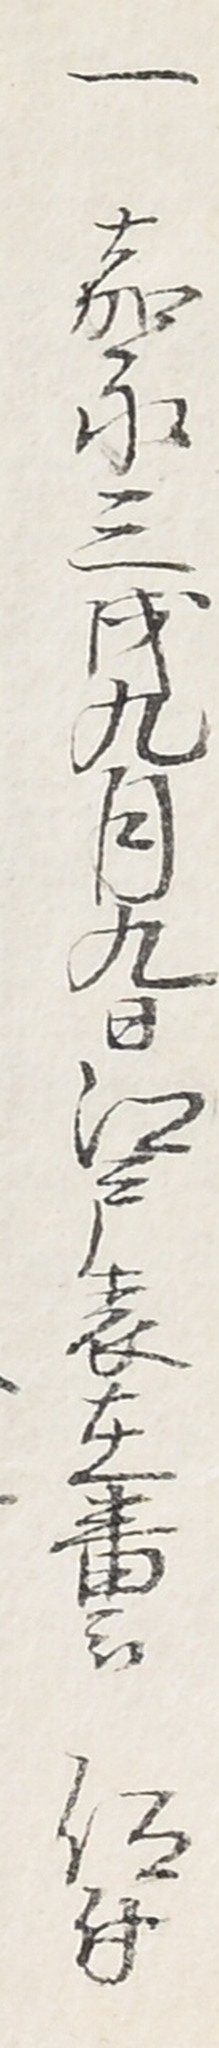一嘉永三戌九月九日江戸表在番被仰付
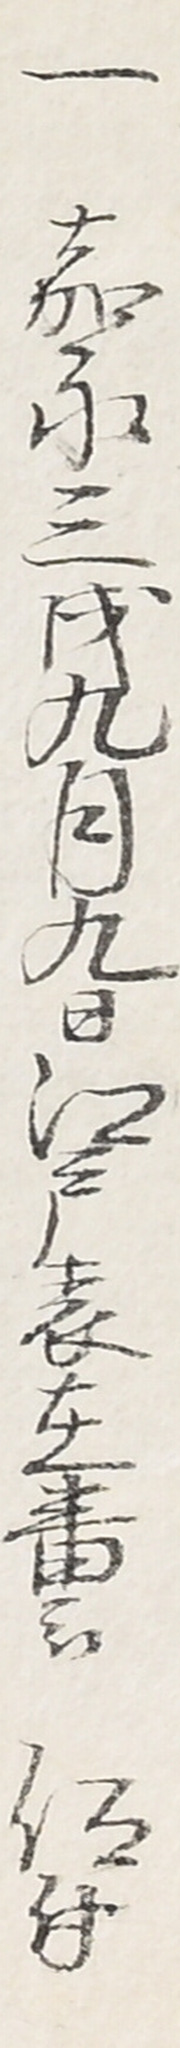一嘉永三戌九月九日江戸表在番被仰付
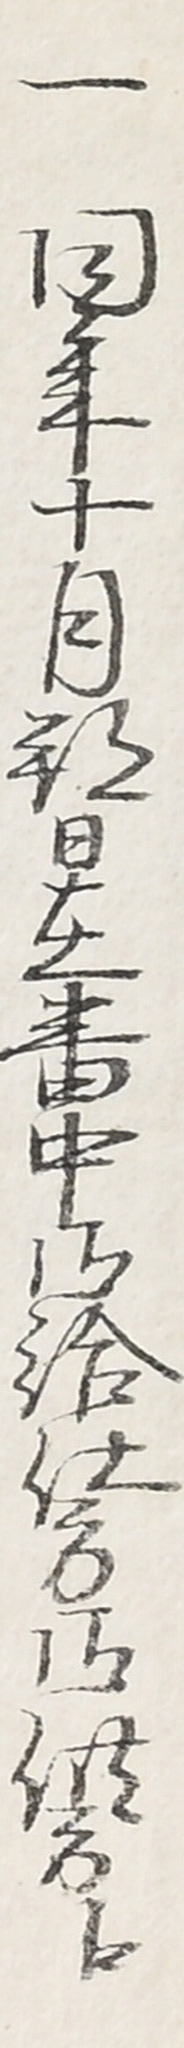一同年十月朔日在番中御給仕方御供方江
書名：無足諸士勤仕録（四）
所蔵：伊那市立高遠町図書館・合同会社AMANE
